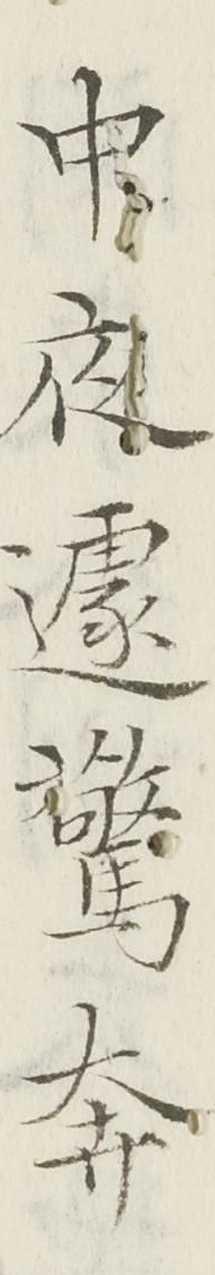中夜遽驚奔
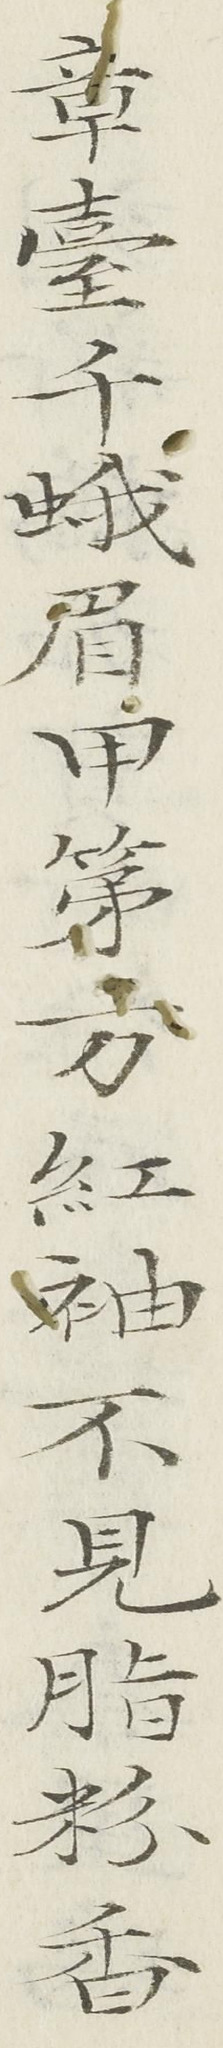章台千蛾眉甲第万紅袖不見脂粉香
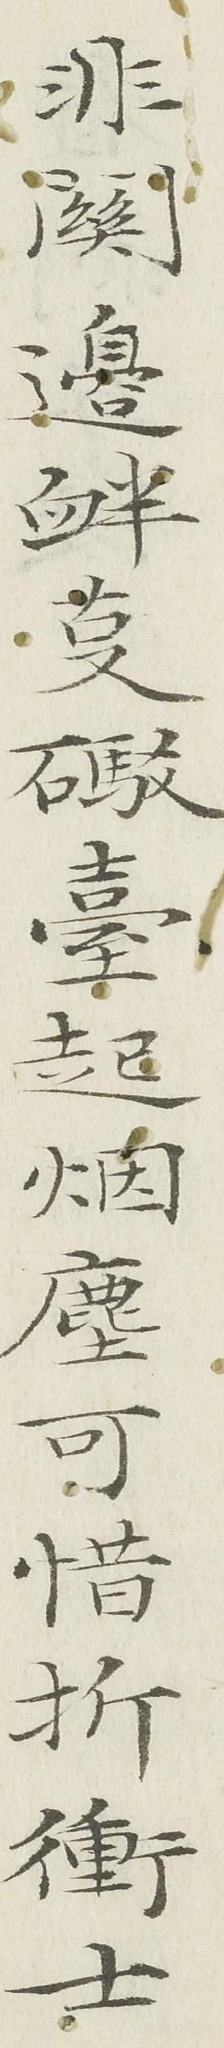非関辺衅事礟壱起烟塵可惜折衝士
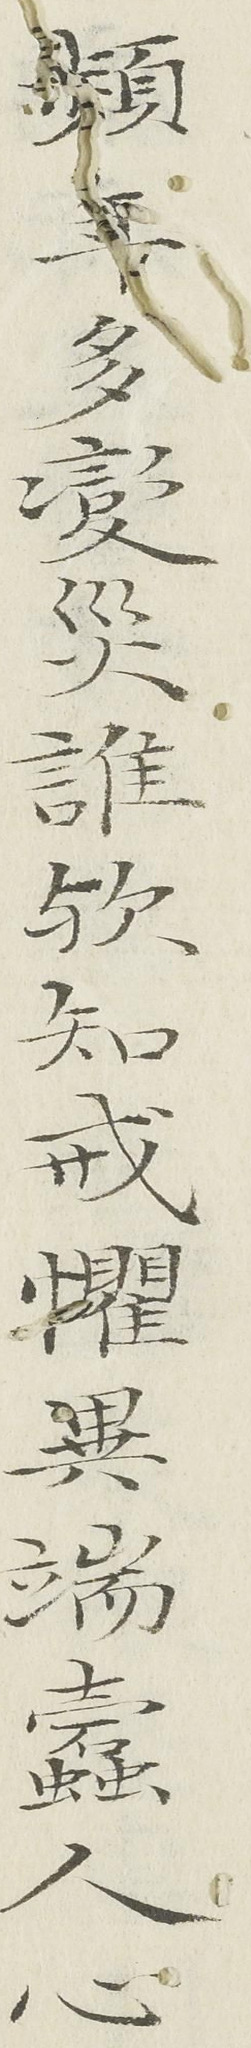頻年？多変災誰歟知戒懼異端蠧人心
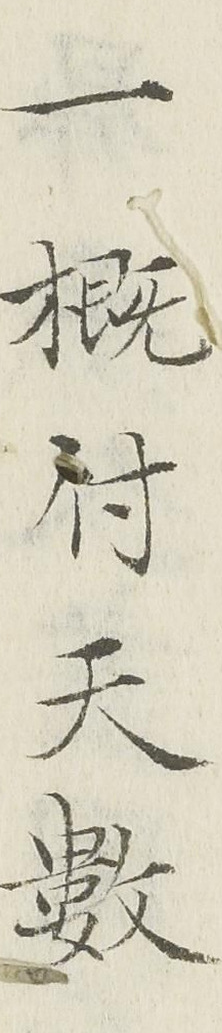一概付天数

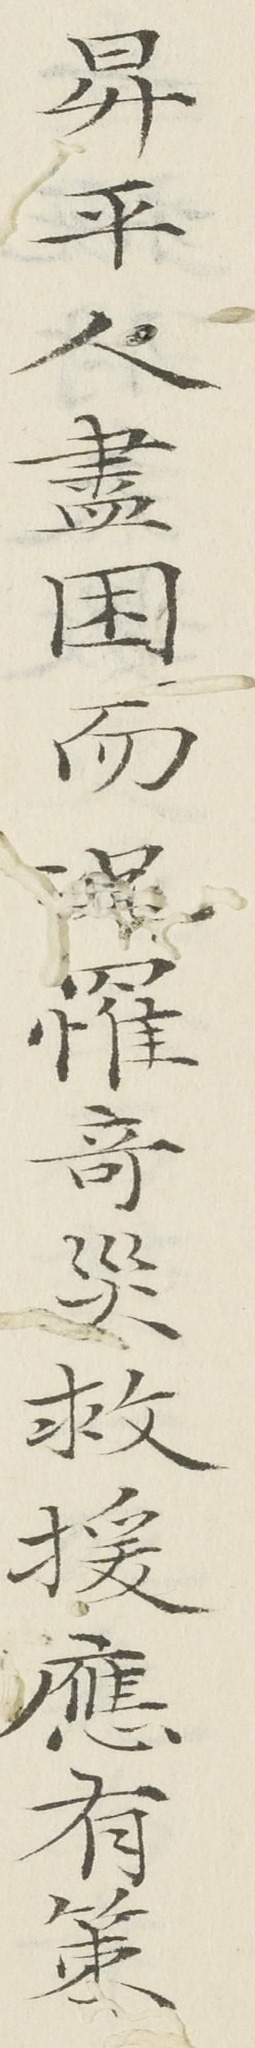昇平人尽困而罹奇災救援応有策
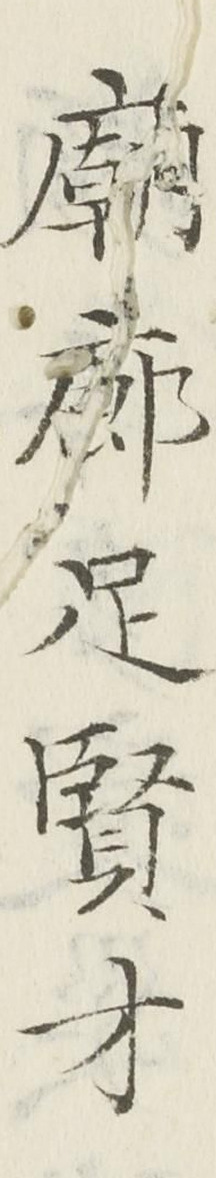廟廊足賢才
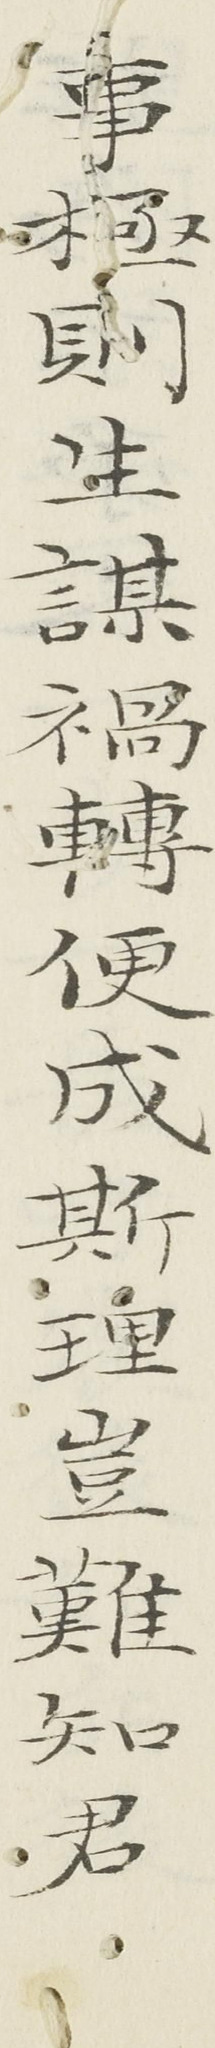事局則生謀禍転便成斯理豈難知君
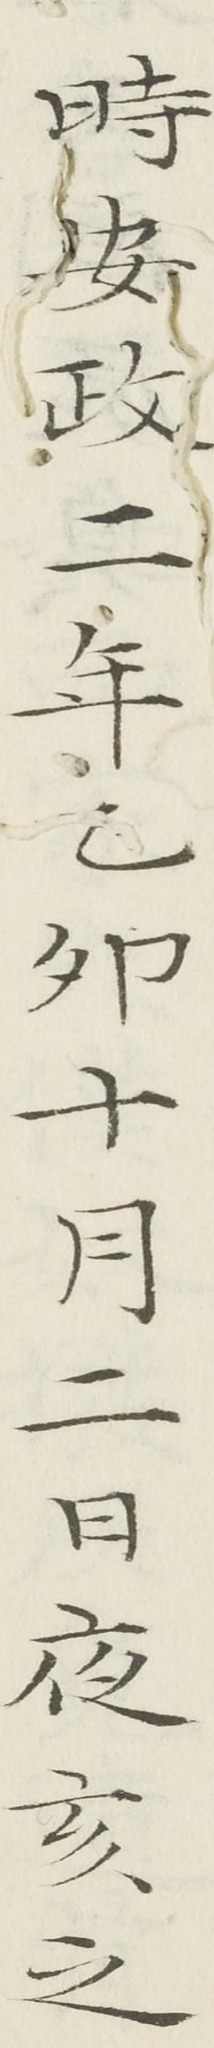時安政二年乙卯十月二日夜亥之
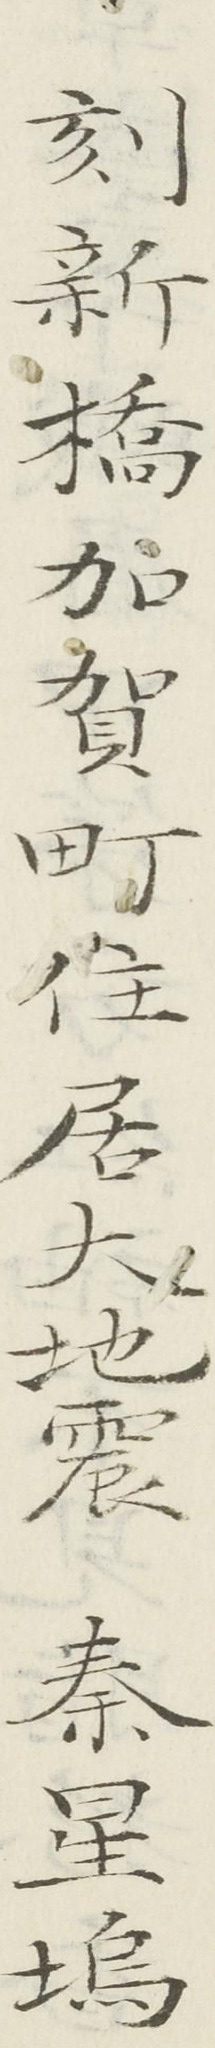刻新橋加賀町住居大地震秦星塢
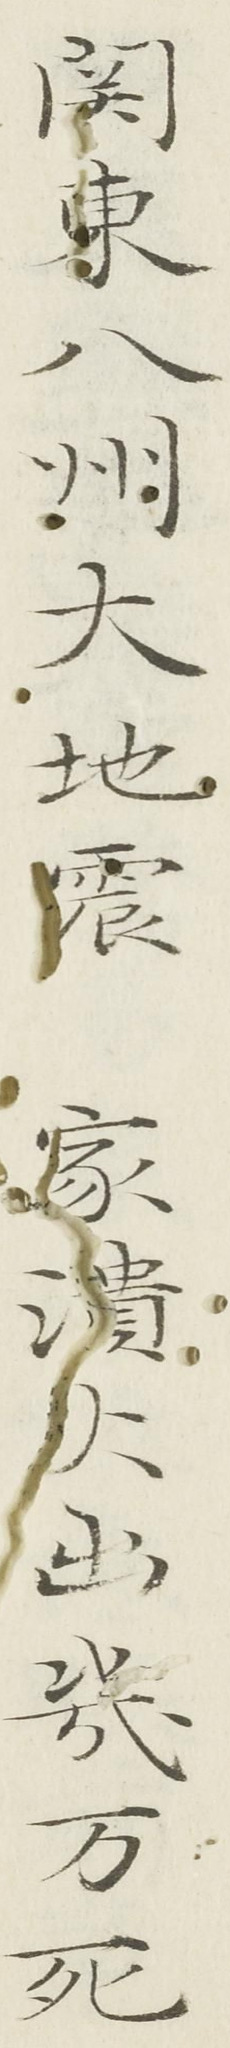関東八州大地震家潰火出幾万死
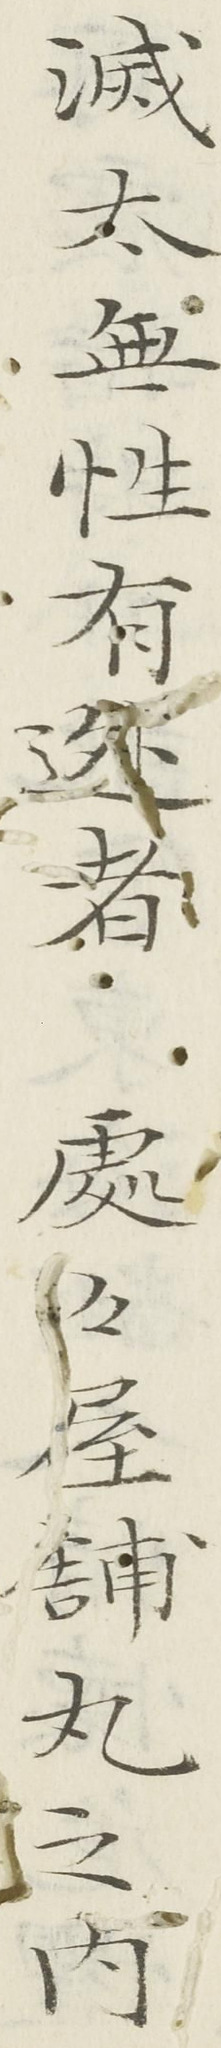滅太無性有逃者処々家舗丸之内
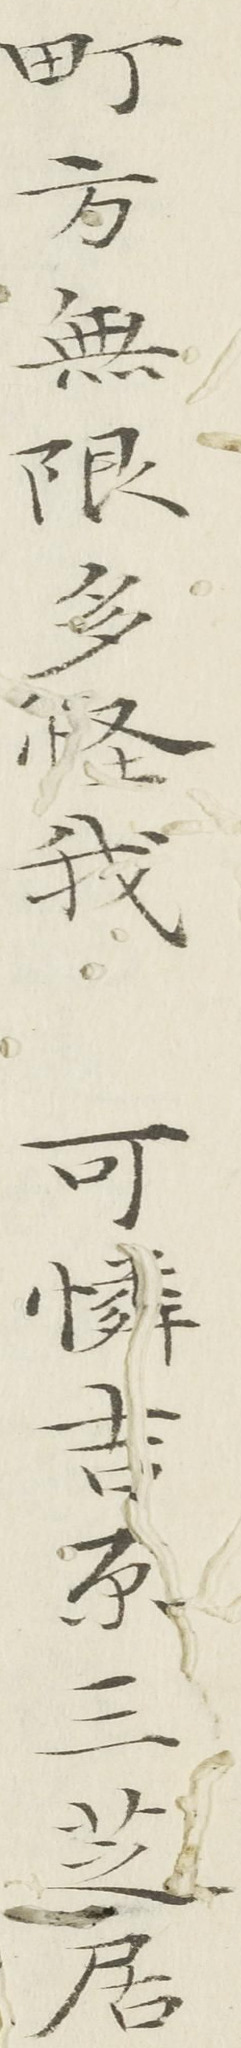町方無限多怪我可憐吉原三芝居
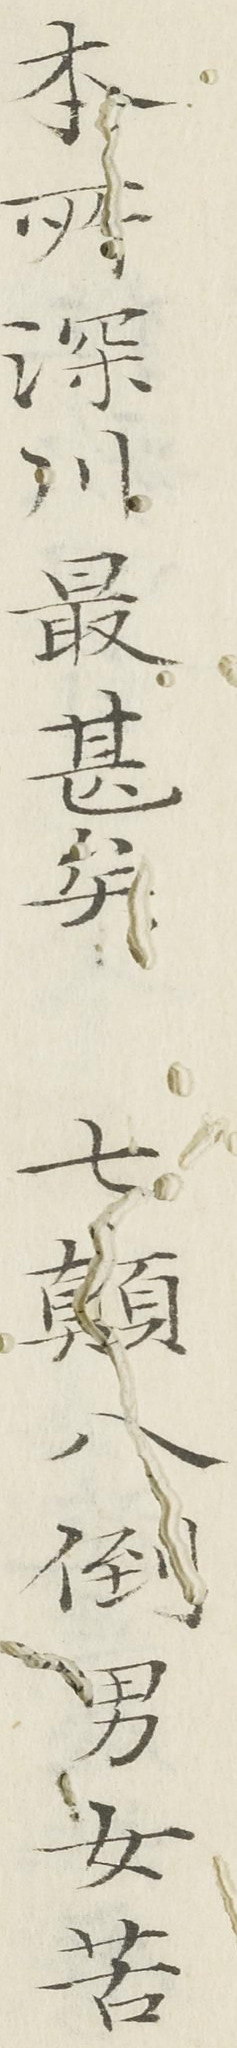本所深川最甚矣七顛八倒男女苦
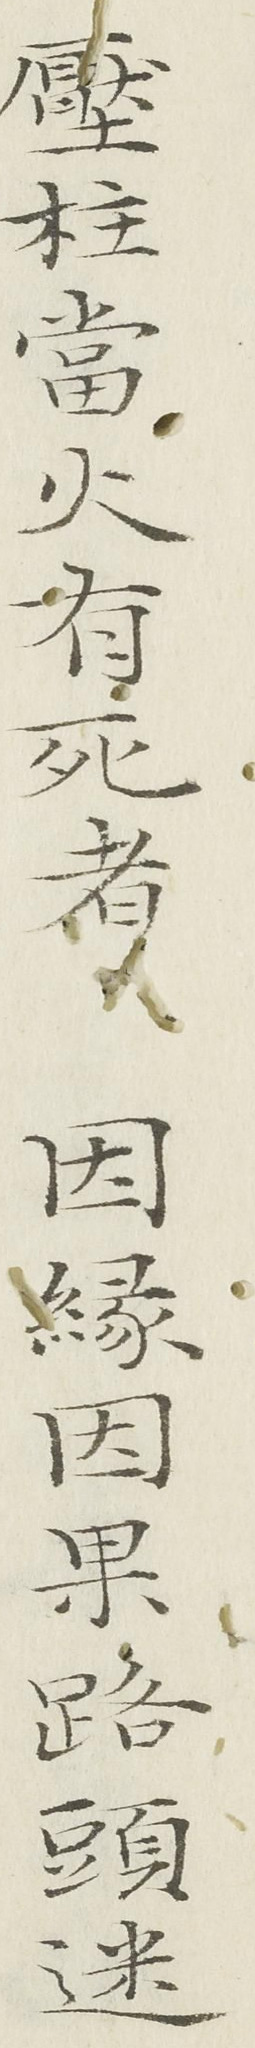圧柱当火有死者因縁因果路頭迷
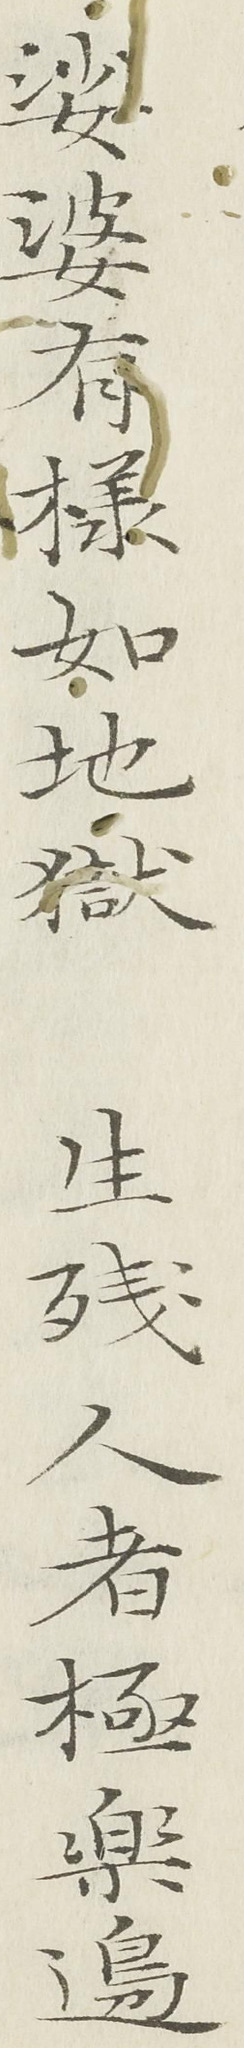娑婆有様如地獄生残人者極楽辺
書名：地震考證　全
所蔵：東京大学地震研究所図書室 Earthquake Research Institute Library, The University of Tokyo, JAPAN
